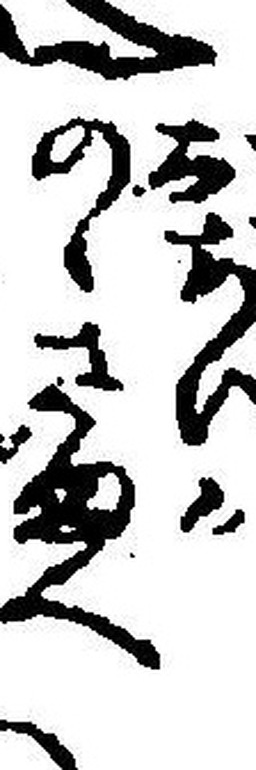のゝさまへ
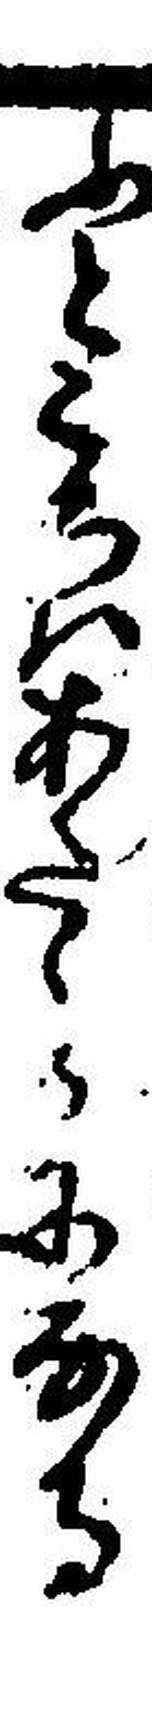ふところはあたゝかになる
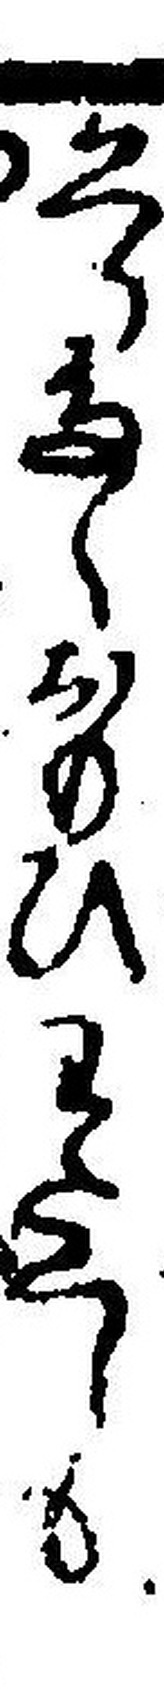かへりたくおもひわたくしも
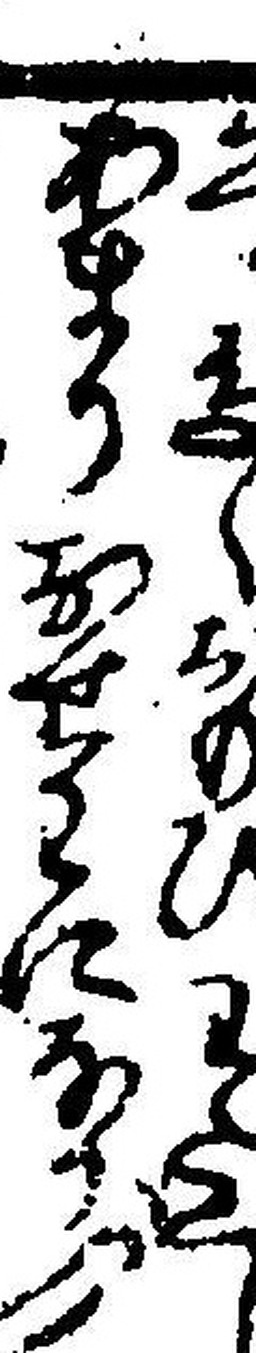あまりおせわになり
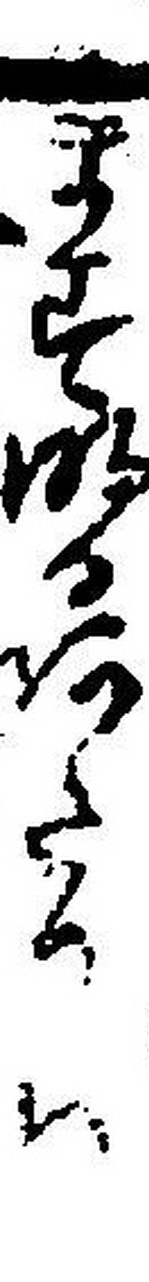ます明日あたりは
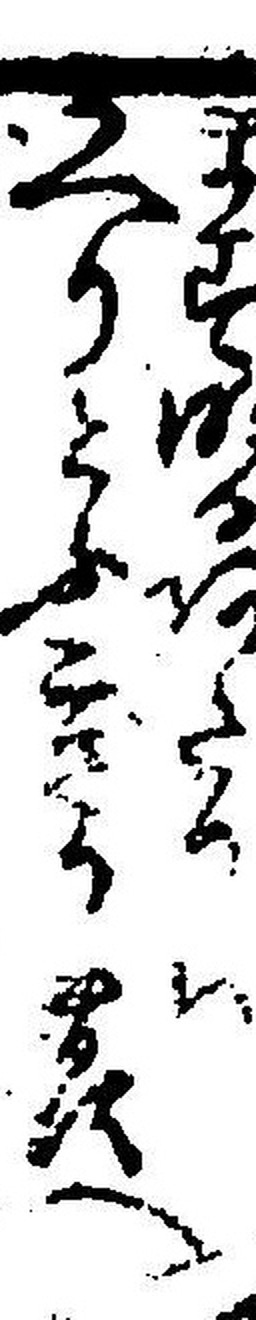かへりとふこざります
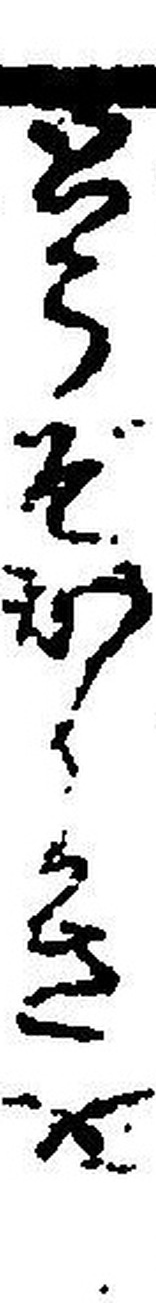どうぞからかさを
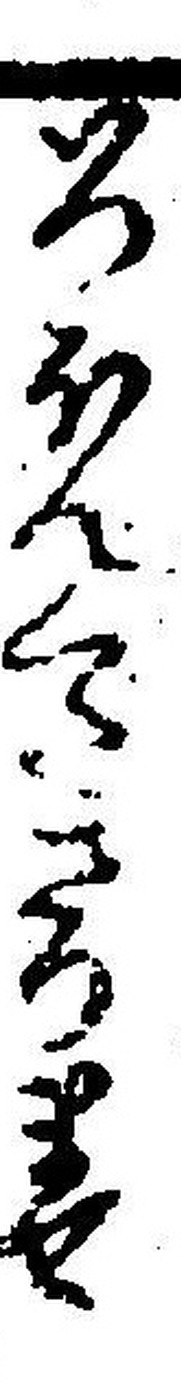いつほんくださりませ
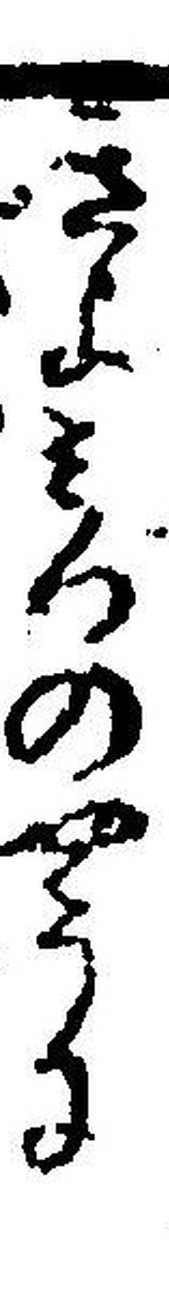きよみつのやうに
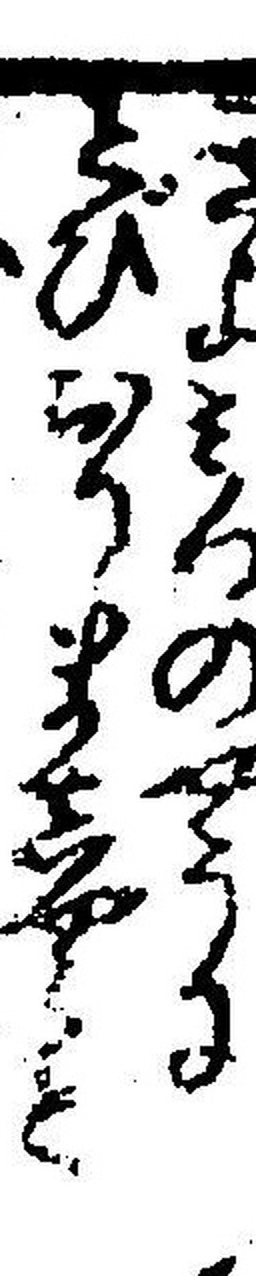とびおりましやうと
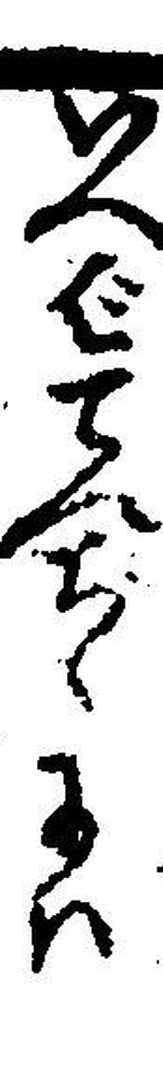いへばてんぢくには
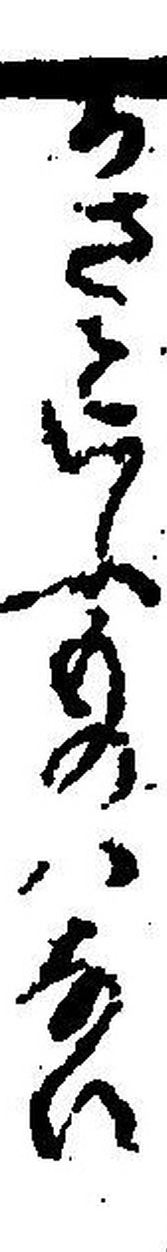かさといふものはない
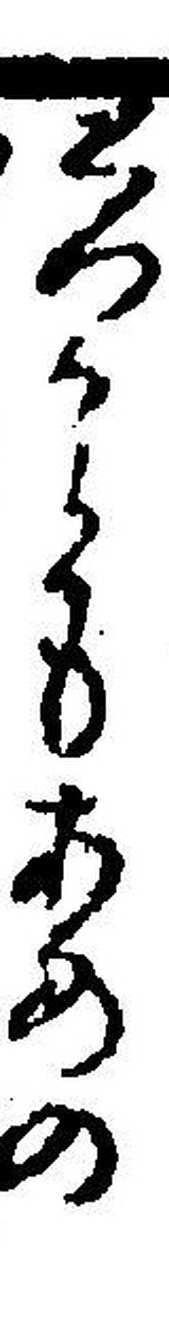とつからもあめの
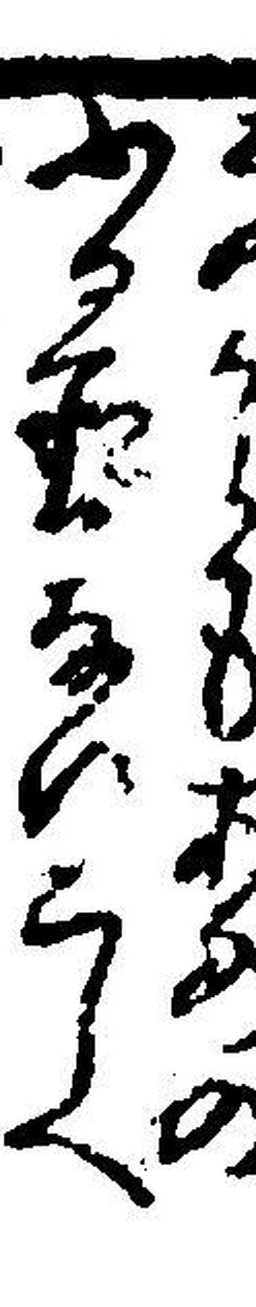ふる所がないこしへ
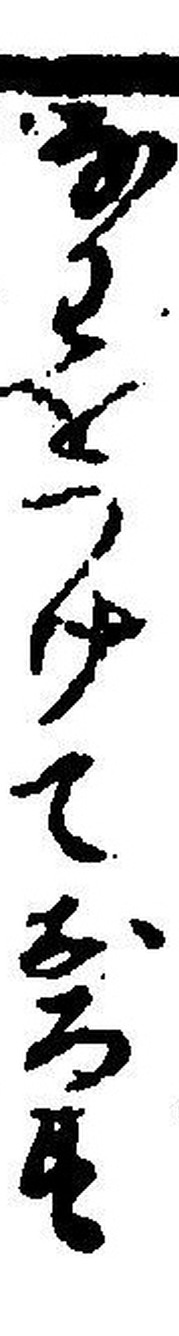なわをつけておろす
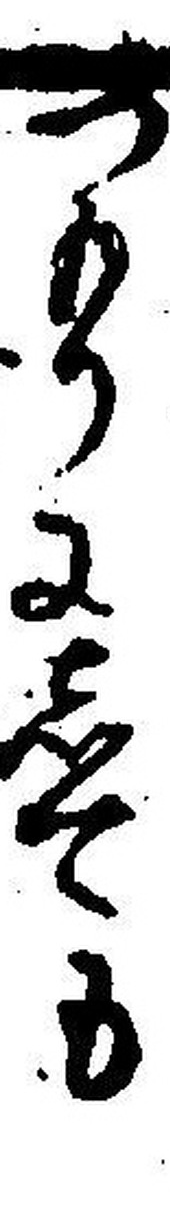つもりにしても
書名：牡丹餅棚有 / 市場通笑作
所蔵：東京大学総合図書館 General Library in the University of Tokyo, JAPAN
